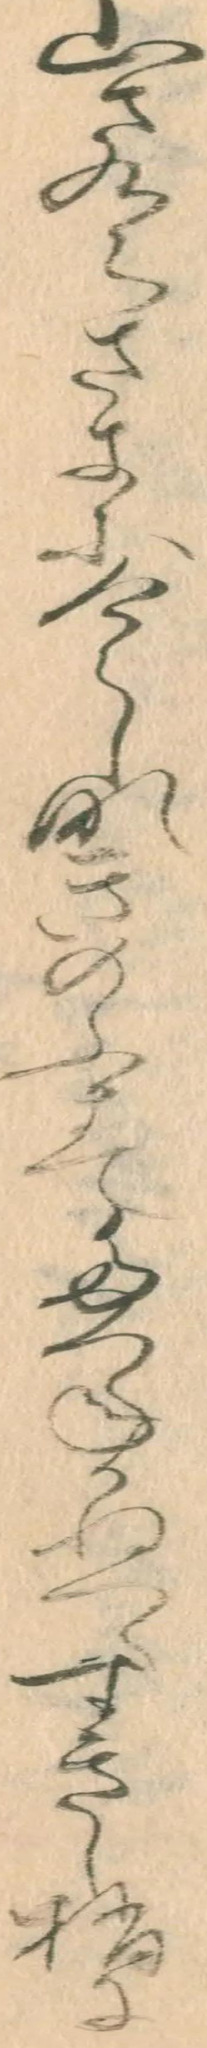山さくらさきにけらしなきのふまてたつねかねつゝすきし梢に
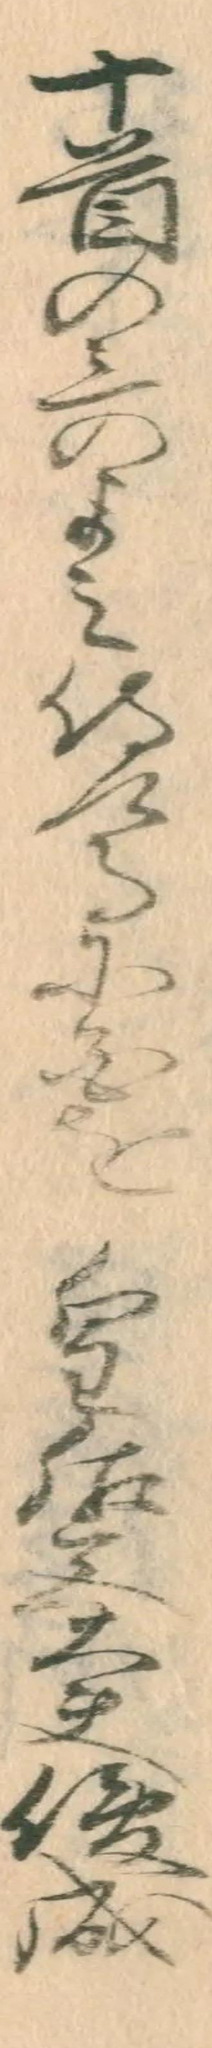十首の歌よみ侍けるに花を皇后宮大夫俊成
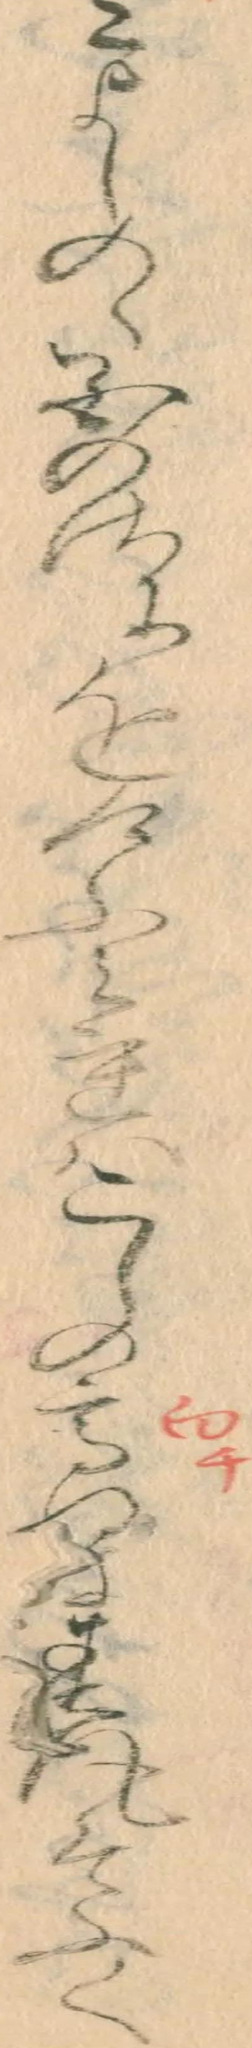みよしのゝ花のさかりをけふみれはこしの高ねに春風そふく
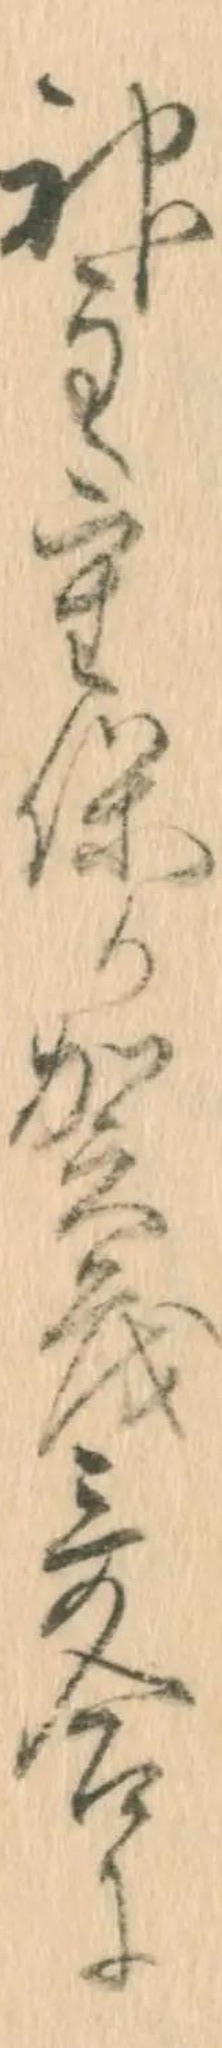神主重保か賀茂歌合に
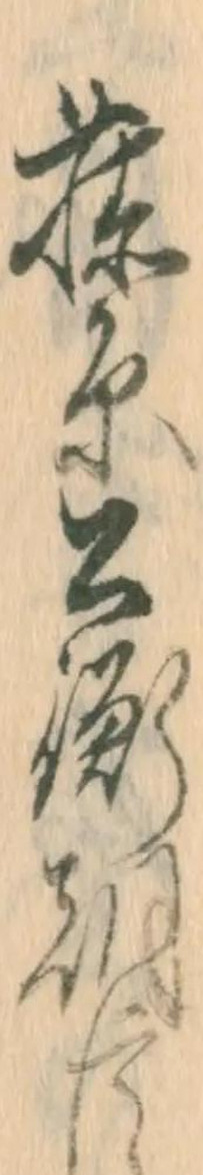千藤原公衡朝臣
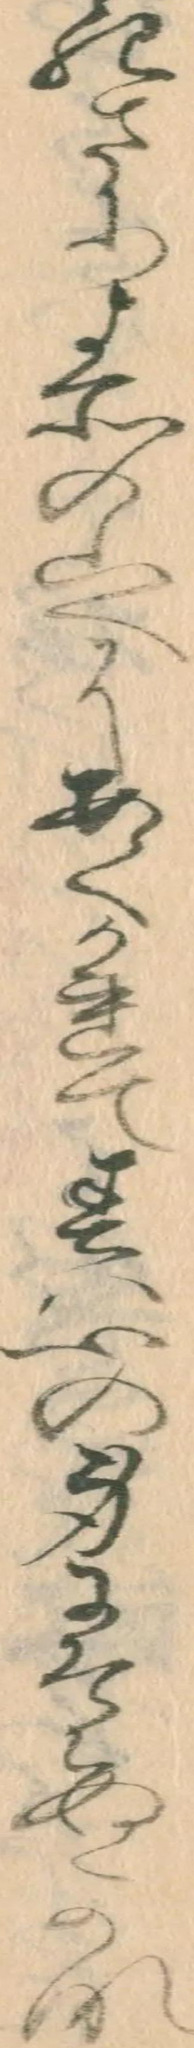花さかりよその山へにあくかれて春は心の身にそはぬかな
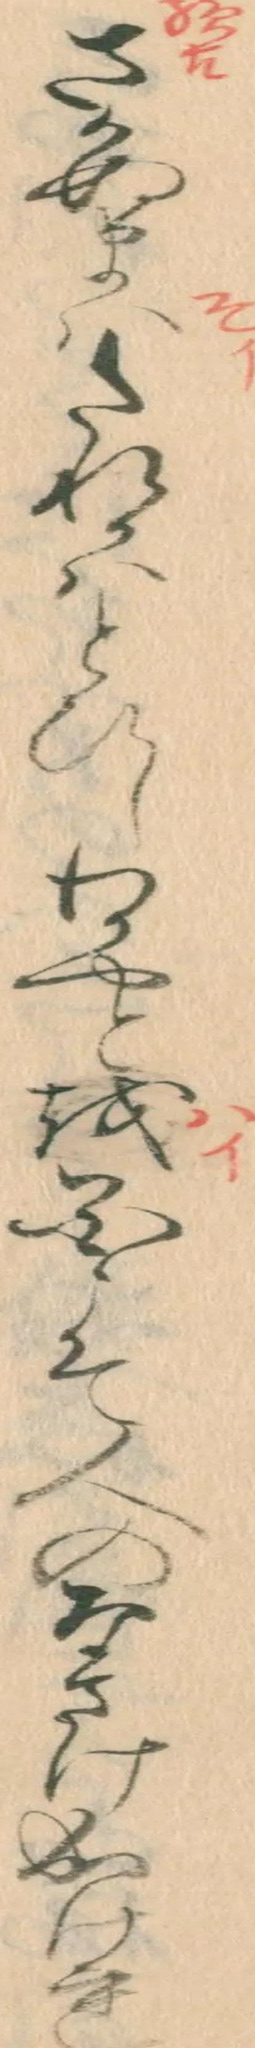さかぬまはたれかはとひしわかやとを花こそ人のなさけ成けれ
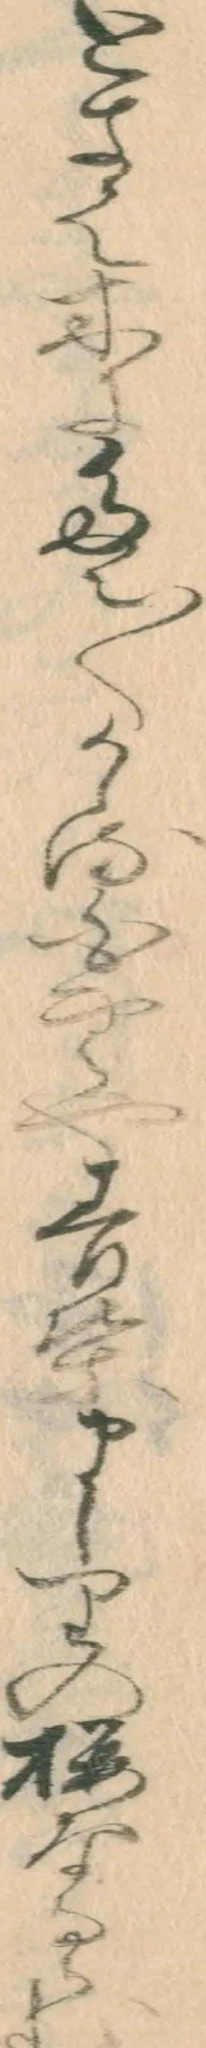ときは木にたえ〳〵かゝる白雲や青葉ましりの桜なるらむ
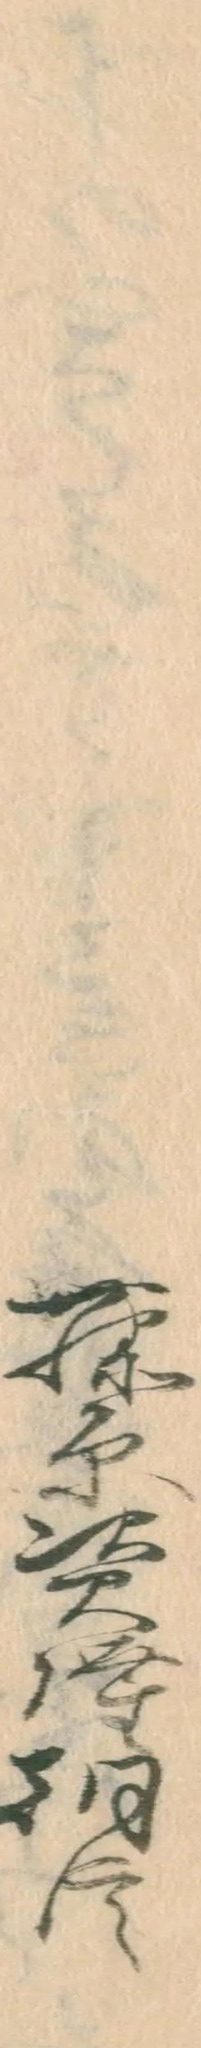藤原資隆朝臣
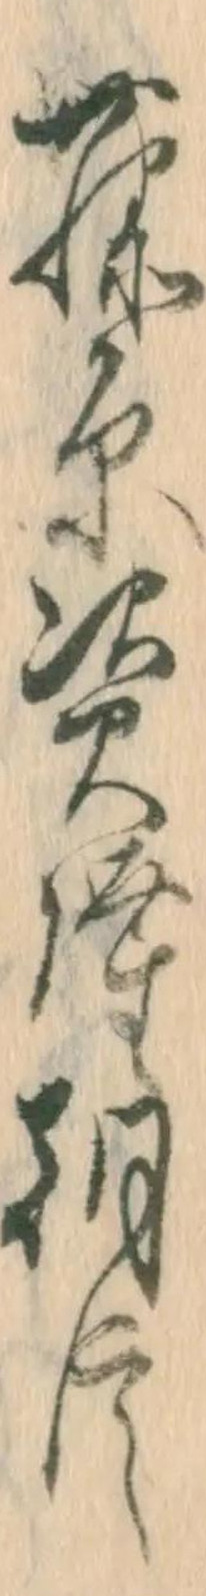藤原資隆朝臣
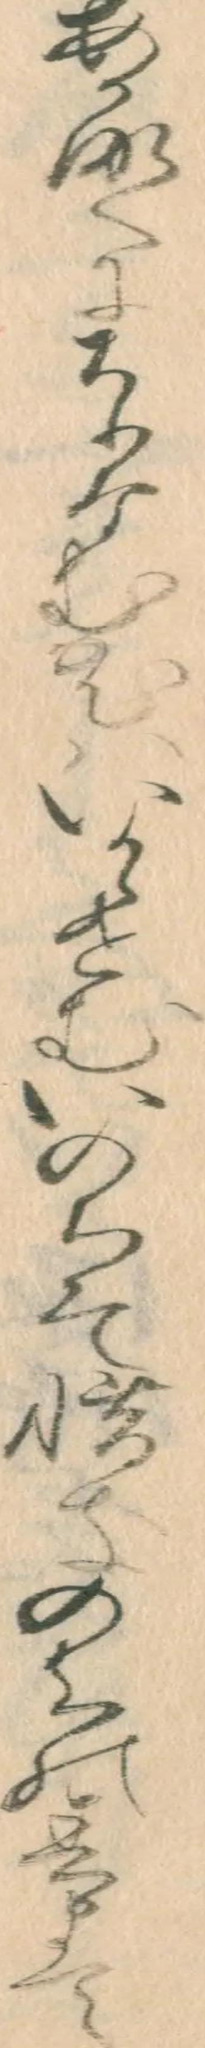あかなくにちりなむ花はいかゝせむいのちそ惜きのちの春まて
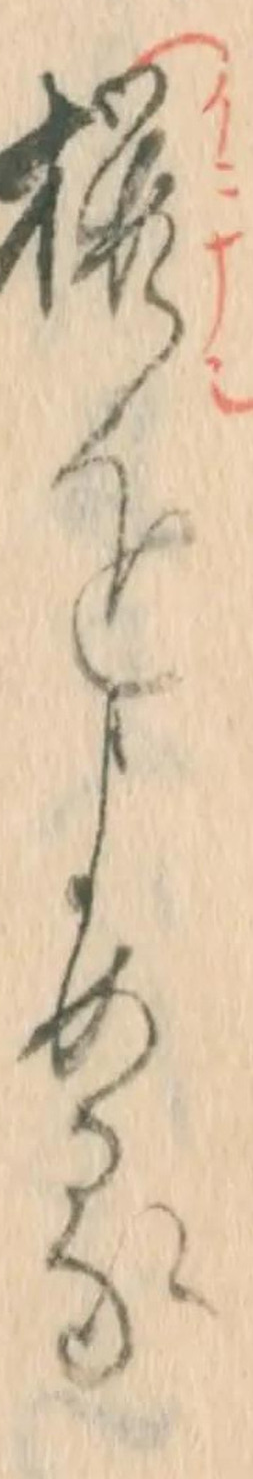桜をよめる
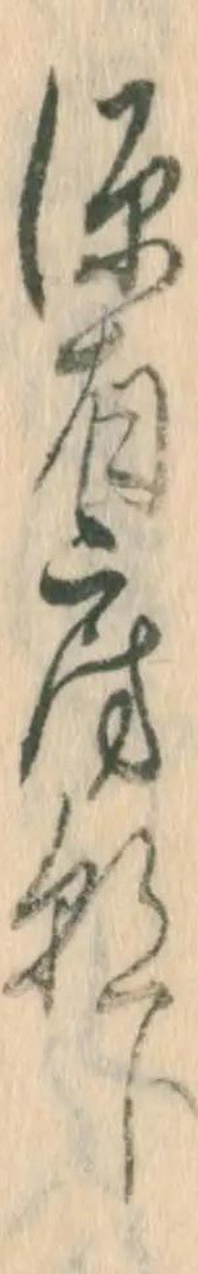源有房朝臣
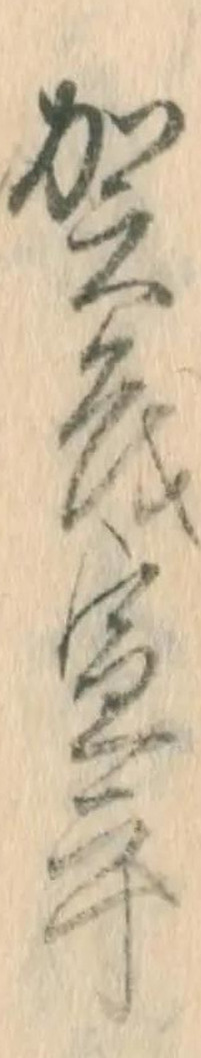賀茂宣平
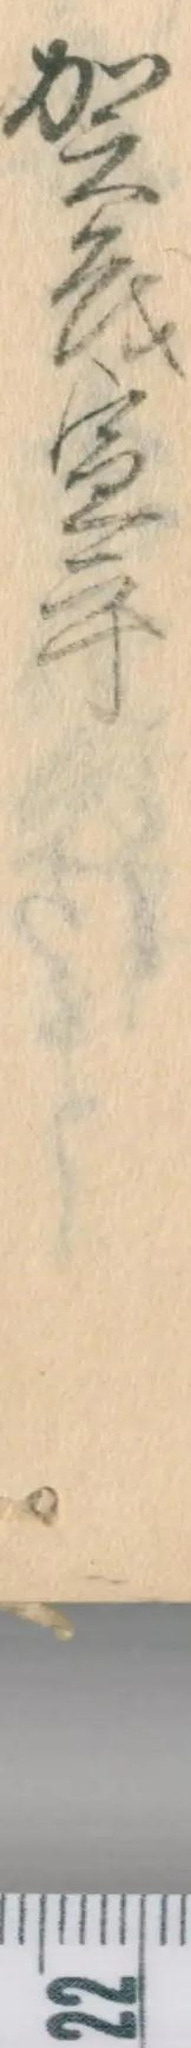賀茂宣平
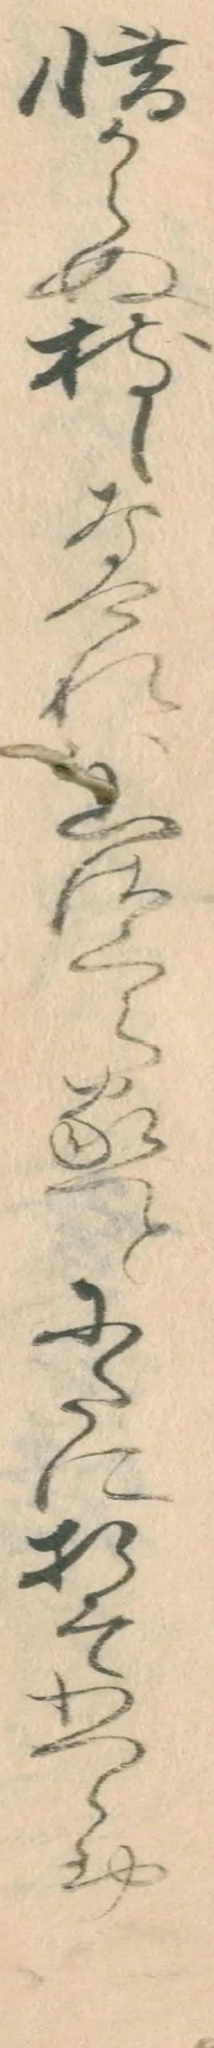惜からぬ枝しなけれは山さくら家つとにたに折そわつらふ
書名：月詣和歌集
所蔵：国立国会図書館 National Diet Library, JAPAN
